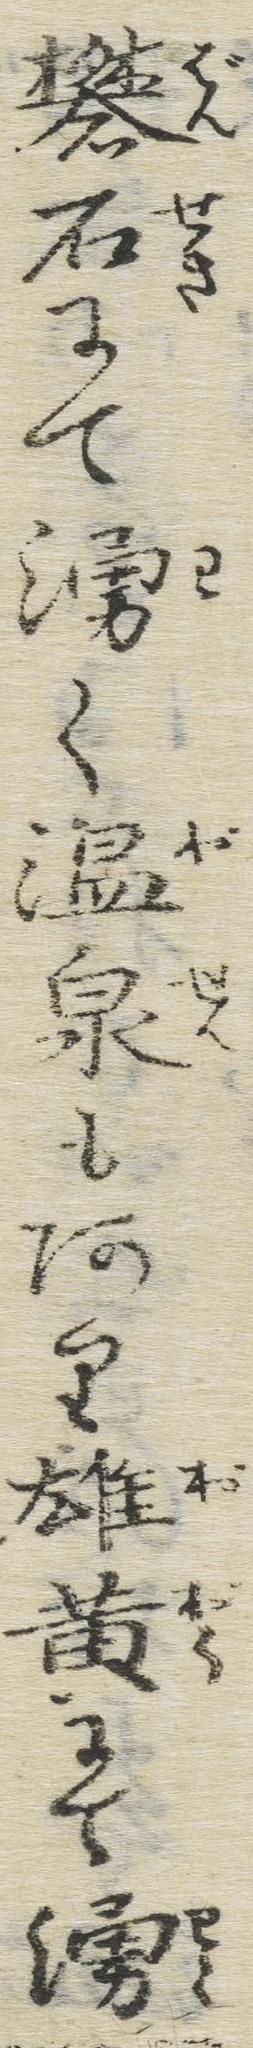礬石にて湧く温泉もあり雄黄にて湧
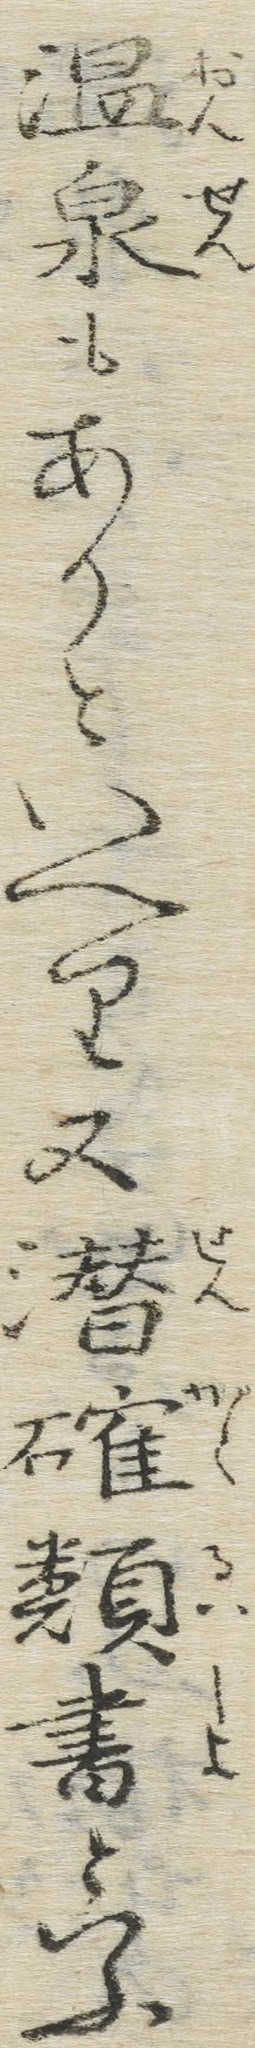温泉もありといへり又潜確類書といふ
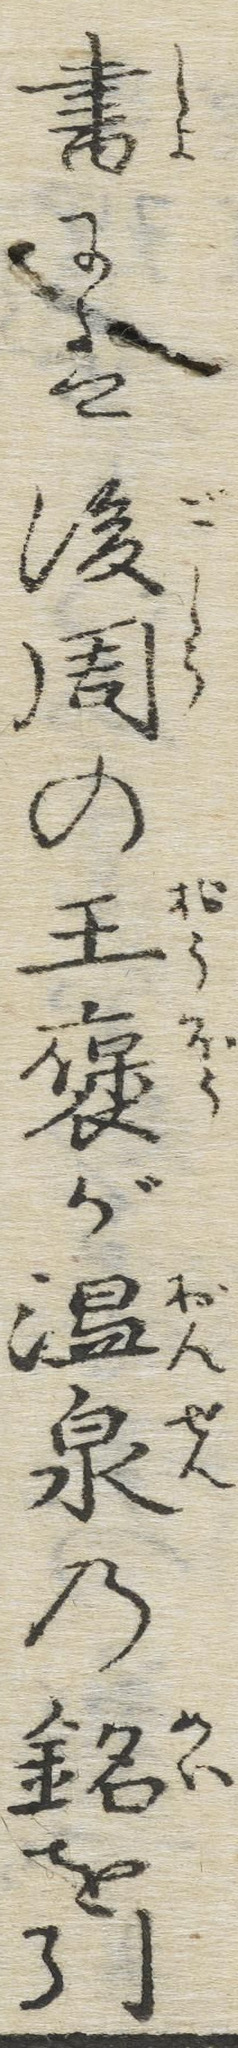書には後周の王褒が温泉の銘を引
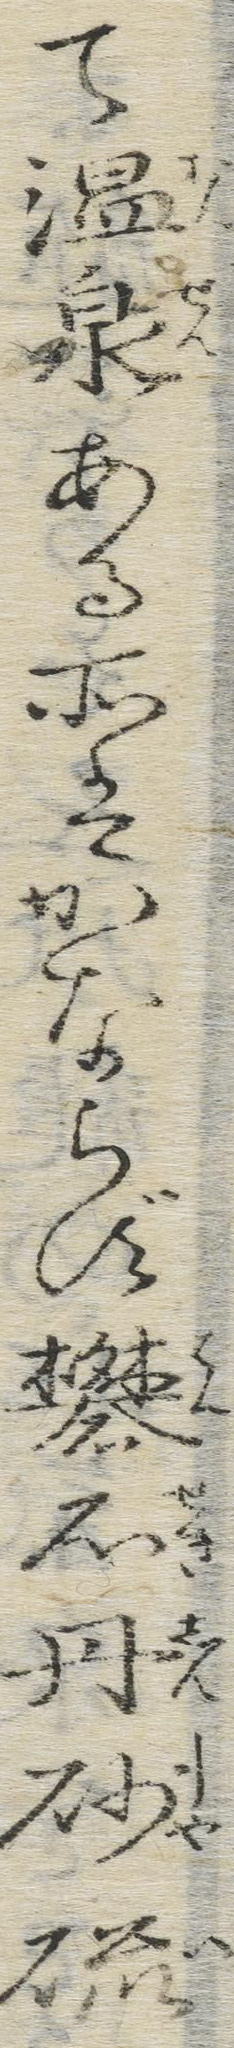て温泉ある所はかならず礬石丹砂硫
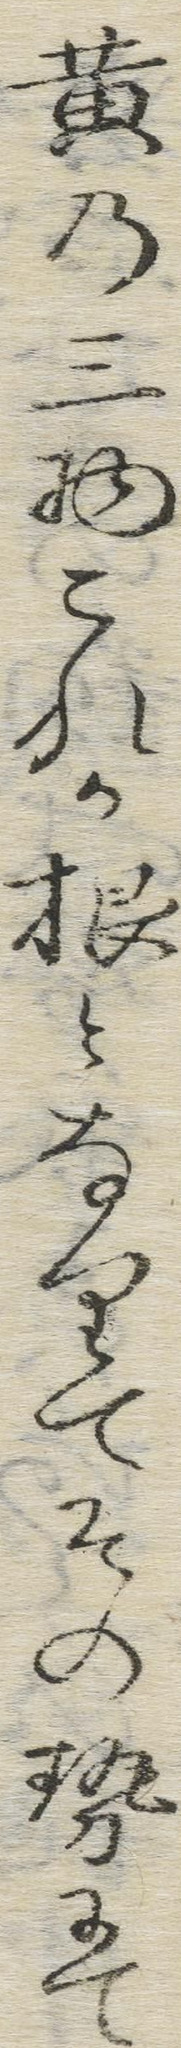黄の三物これか根となりてその勢にて
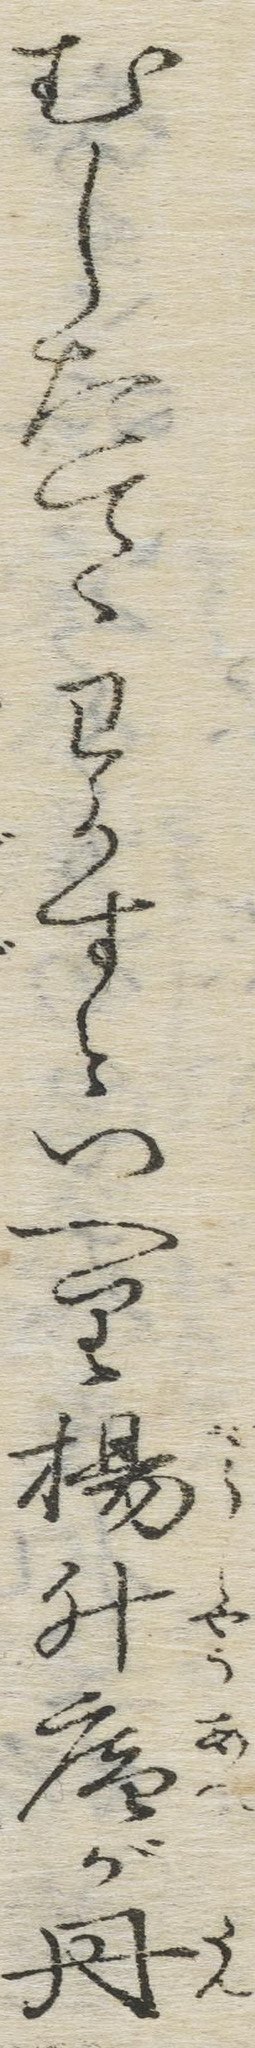むしたてゝわかすといへり楊升庵が丹
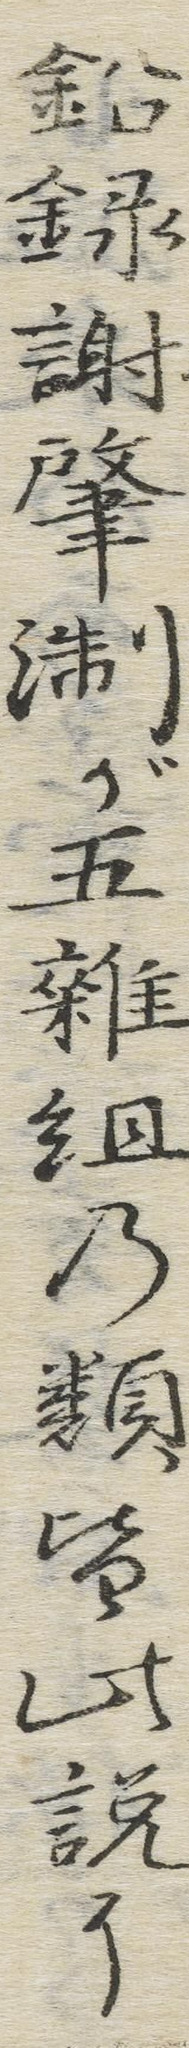鉛録謝肇淛が五雑組の類皆此説に
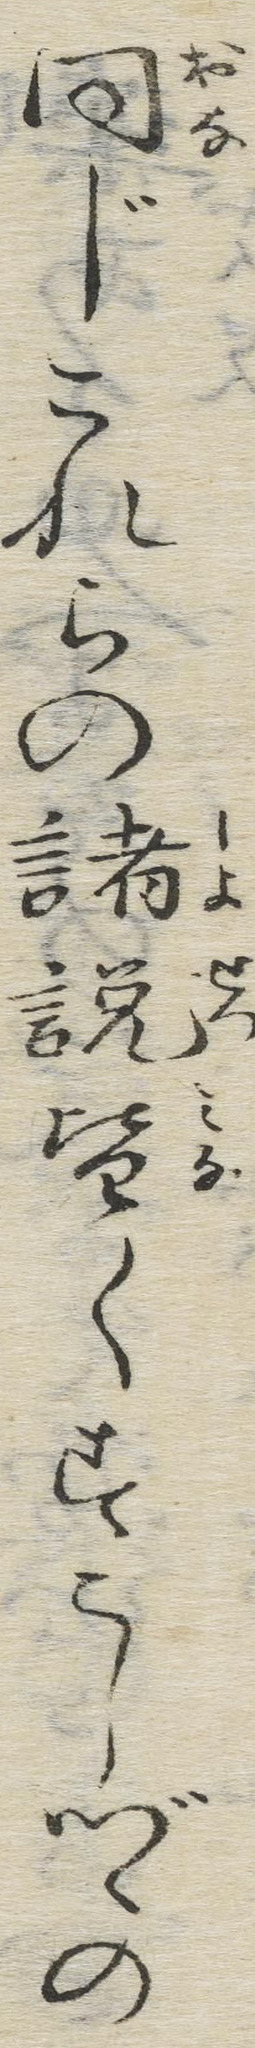同じこれらの諸説皆〳〵すこしづゝの
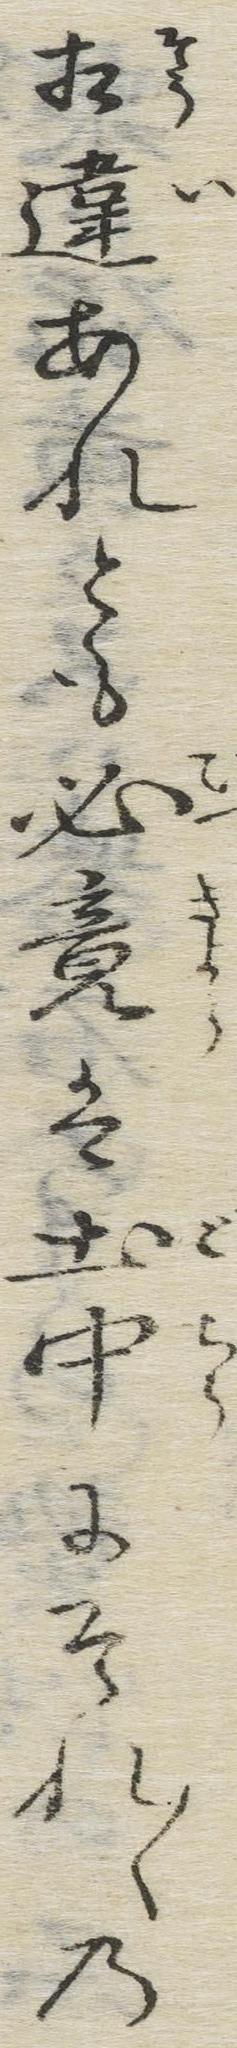相違あれとも必竟は土中にそれ〳〵の
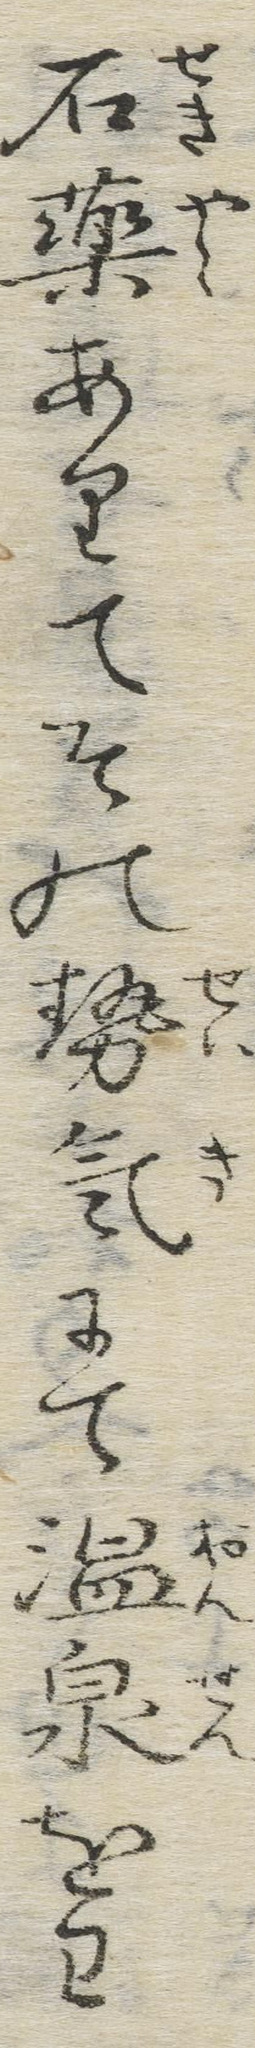石薬ありてその勢気にて温泉をわ
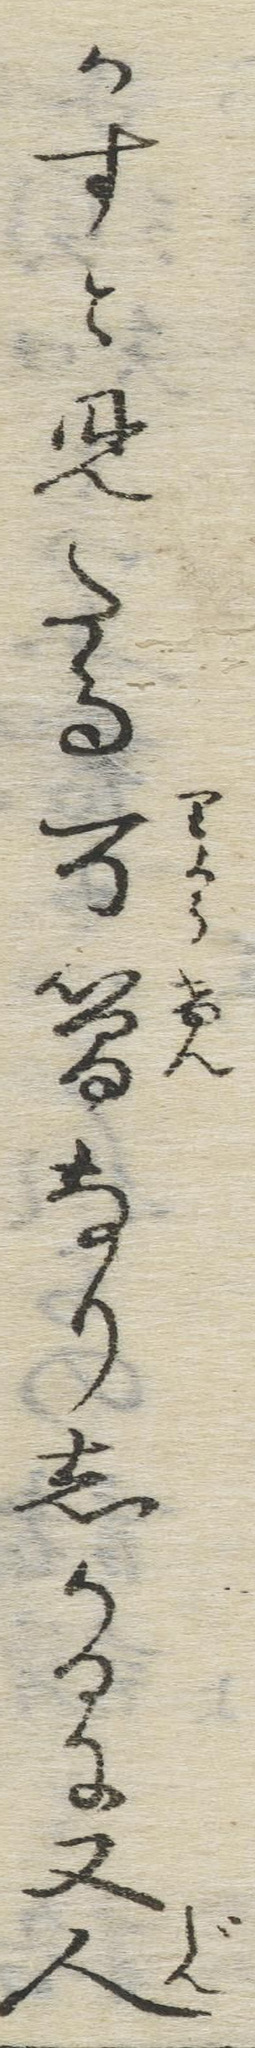かすと見たる了簡なりしかるに又人

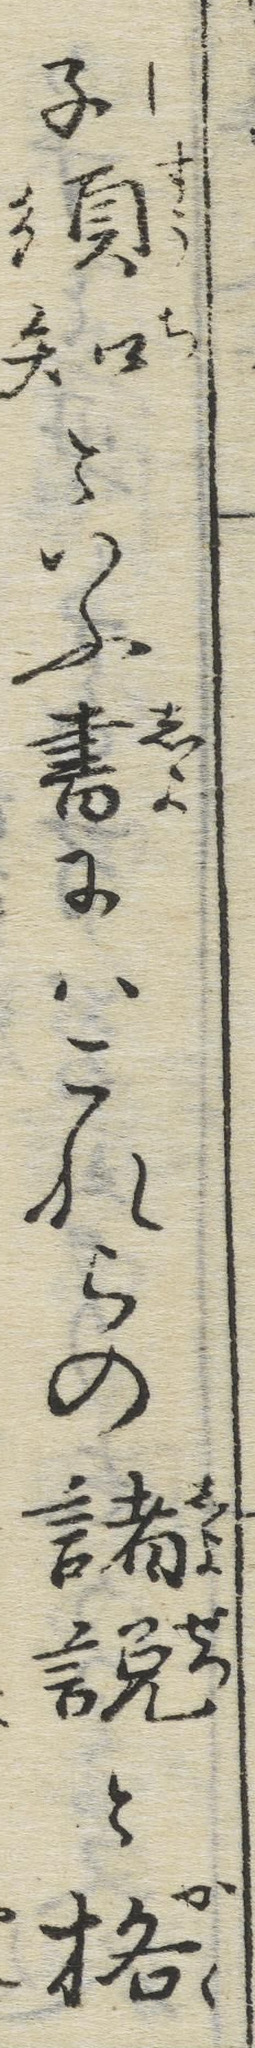子須知といふ書にはこれらの諸説と格
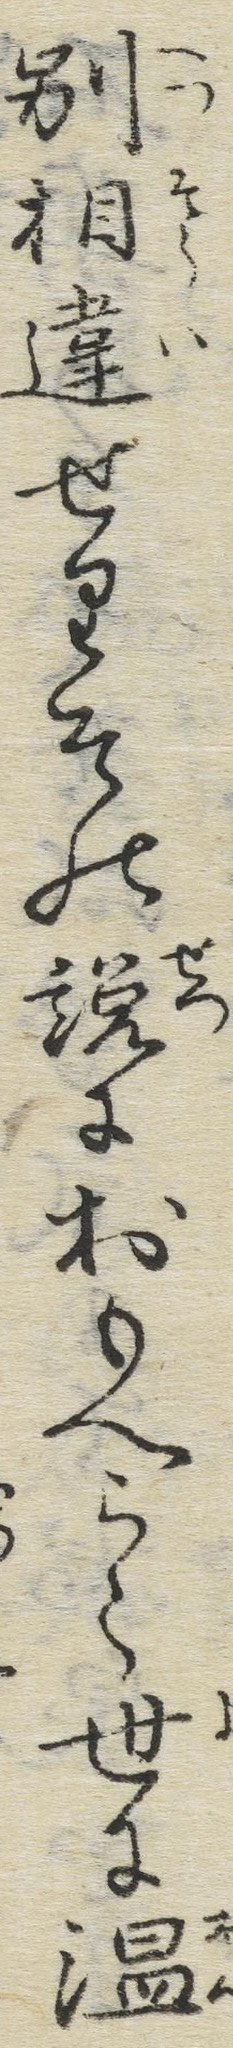別相違せりその説におもへらく世に温
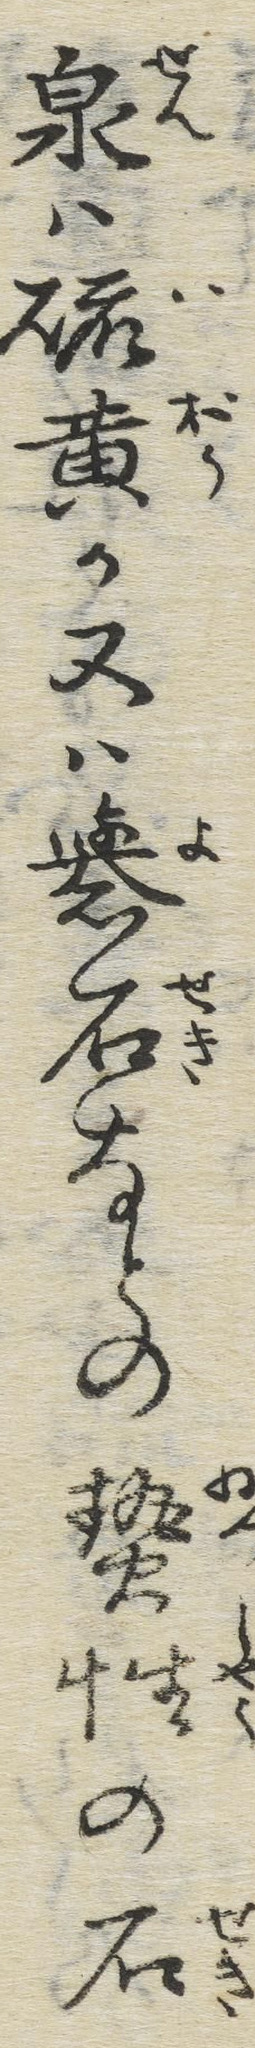泉は硫黄か又は礜石なとの熱性の石
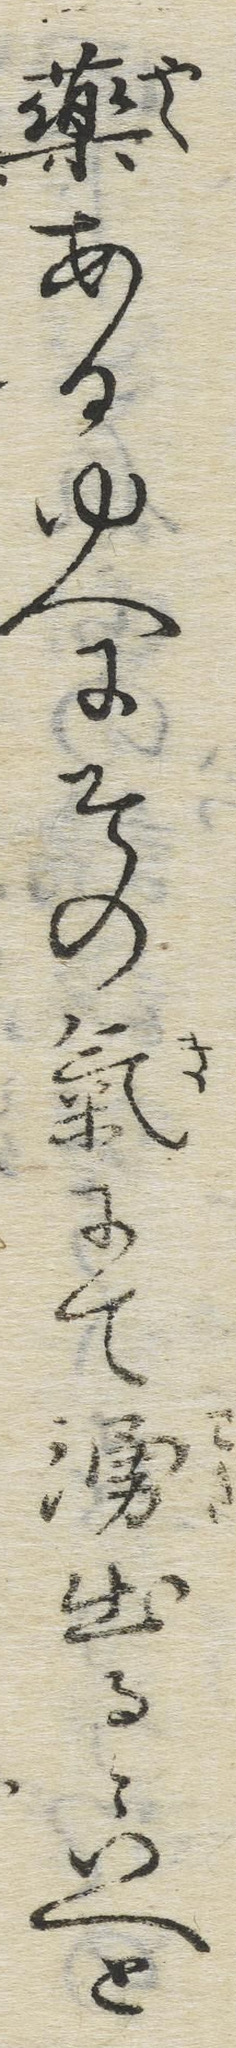薬あるゆへにその気にて湧出るといへと
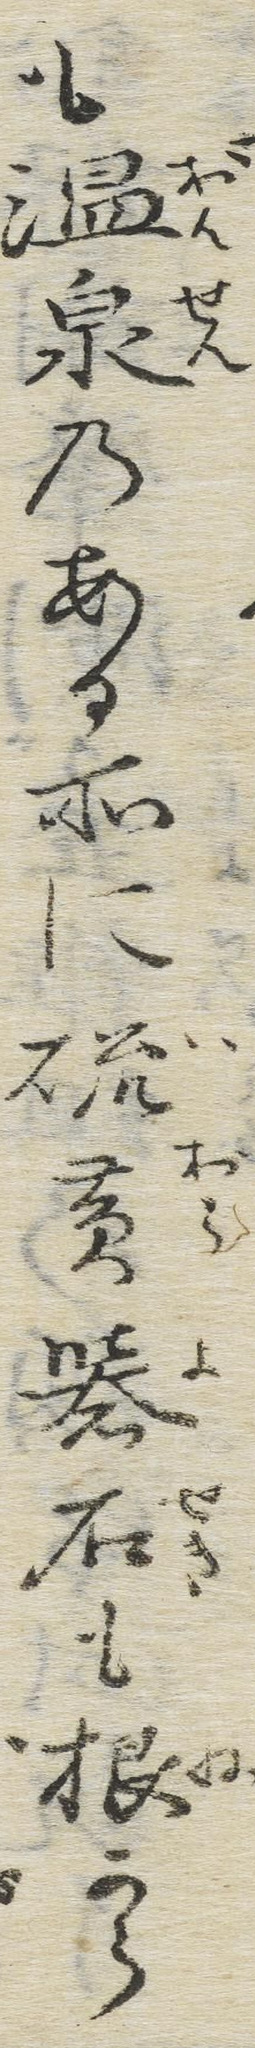も温泉のある所に硫黄礜石も根から
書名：温泉考
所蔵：東京大学地震研究所図書室 Earthquake Research Institute Library, The University of Tokyo, JAPAN
